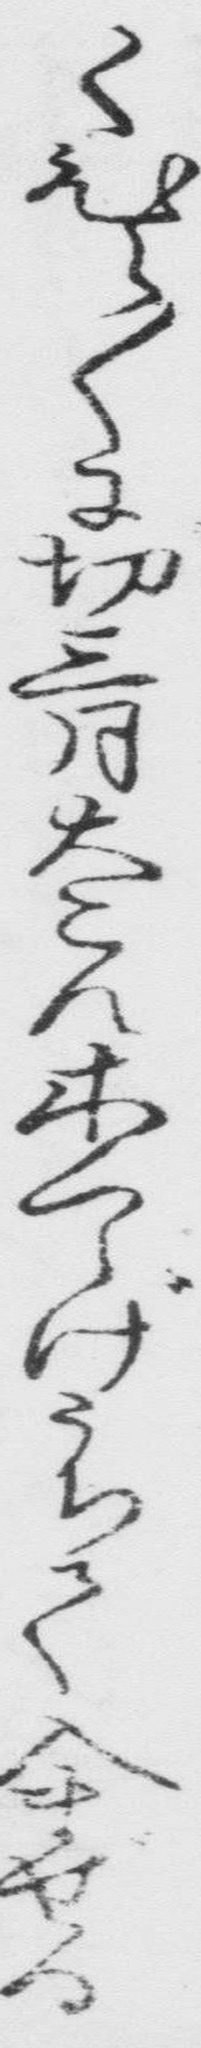くひら〳〵に切三月大こん木くらげうちて入ませる
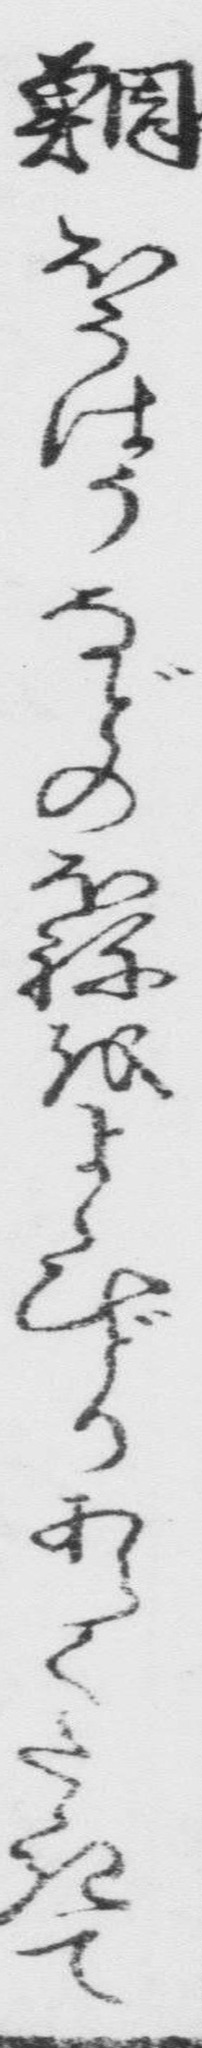鯛ほうはうなどのほねをよくひどりあらくさ？きて
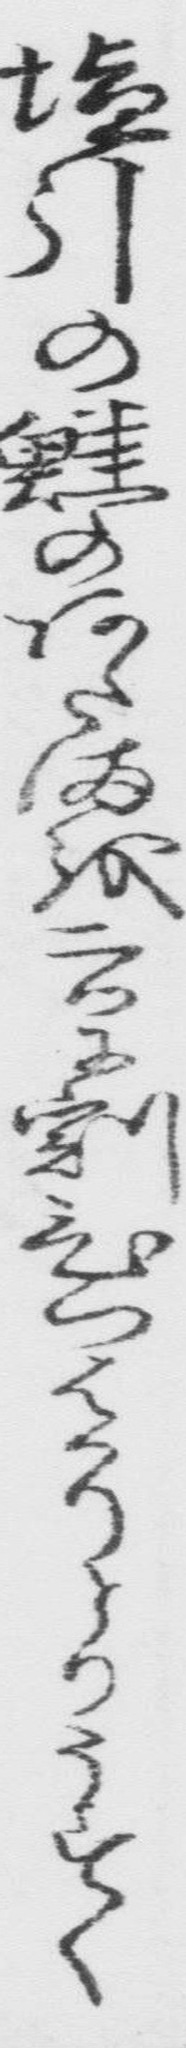塩引の鮭のあたまを二つに割ひつはかりとりうすく
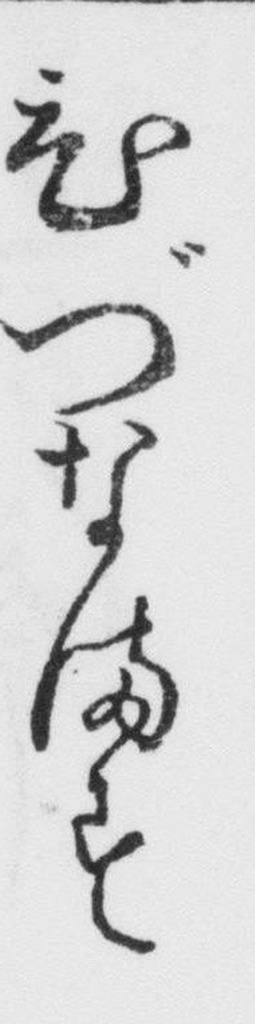ひづなます
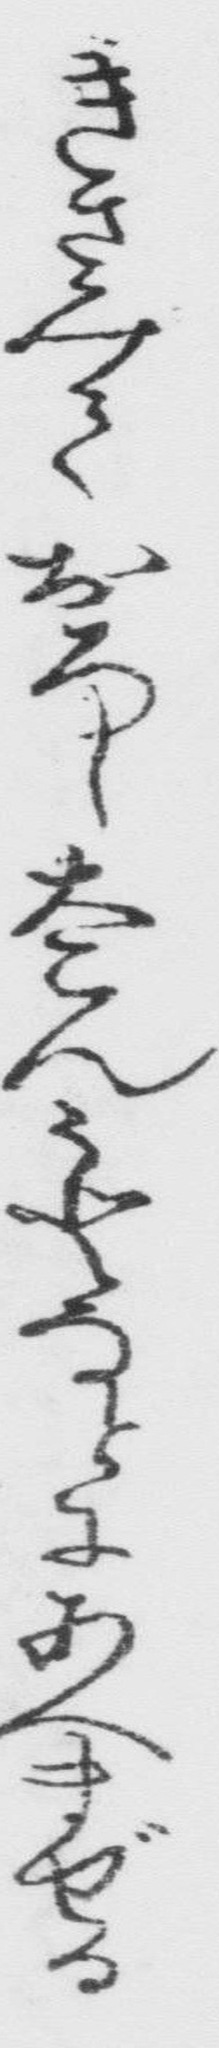きさみておろし大こんうとなとにあへまぜる
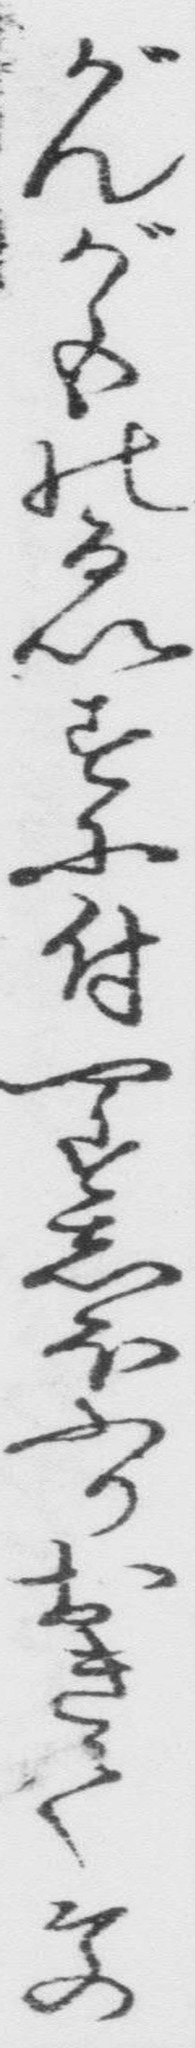がんがものるいすに付やすしほふりおきてその
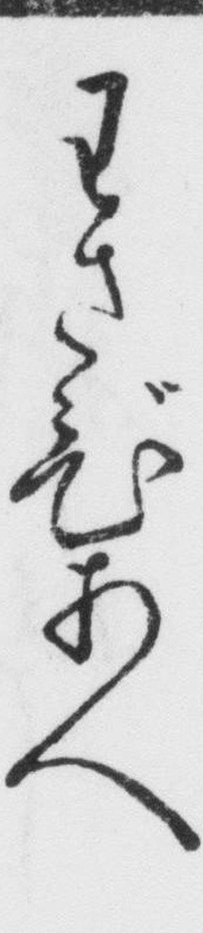わさびあへ
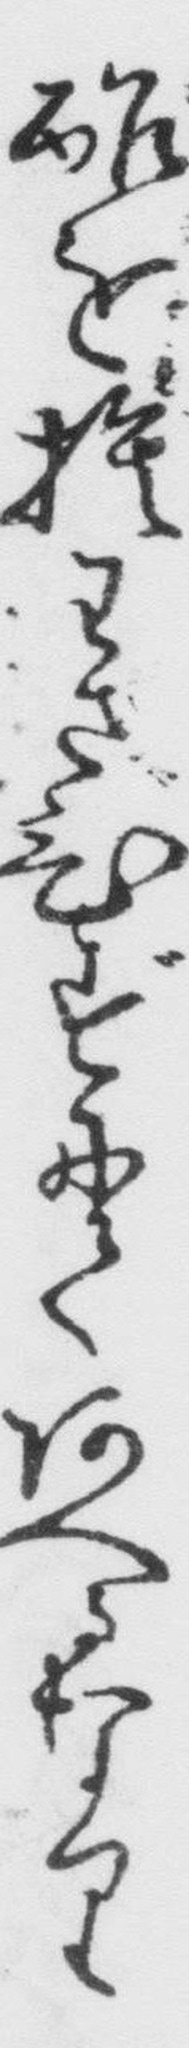酢を捨わさひずにてあへるなり
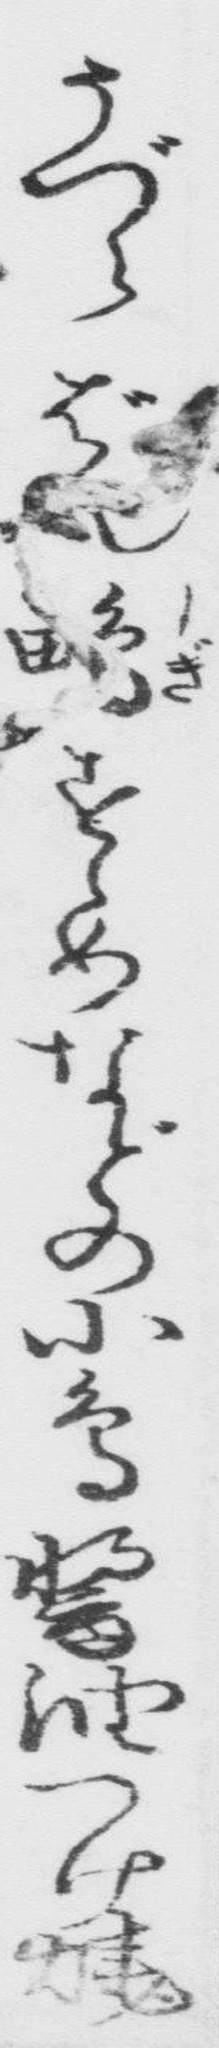うづらばん鴫すゝめなどの小鳥醤油につけ焼
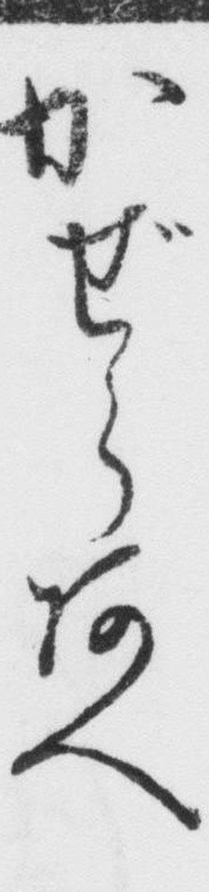かぜらあへ
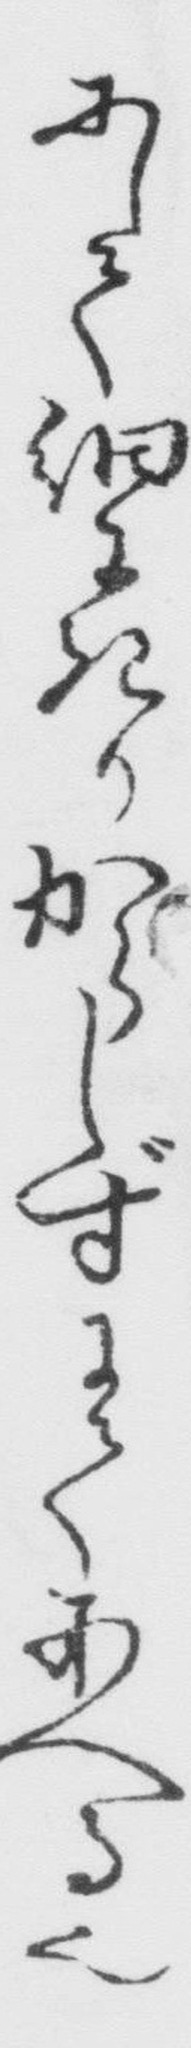にして細にきりからしずにてあへる也
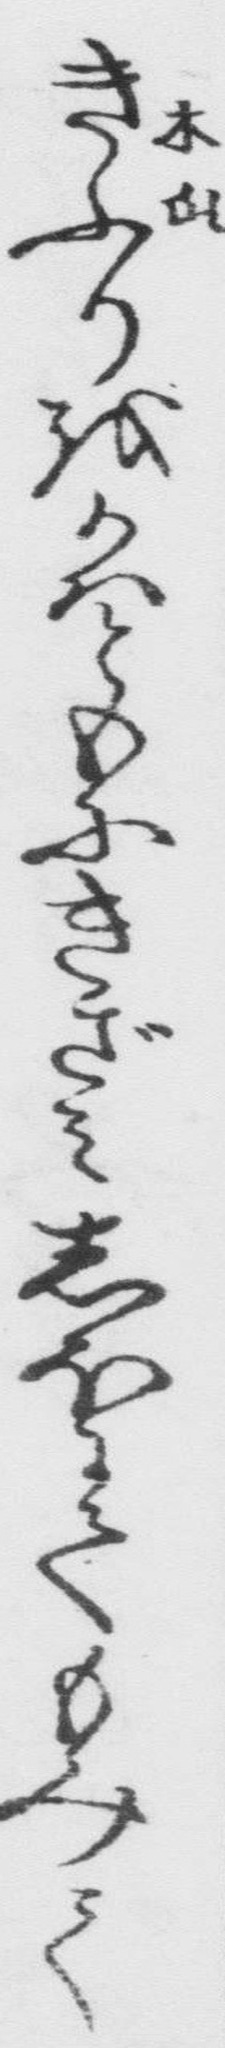きふりをかはともにきざみしほにてもみ
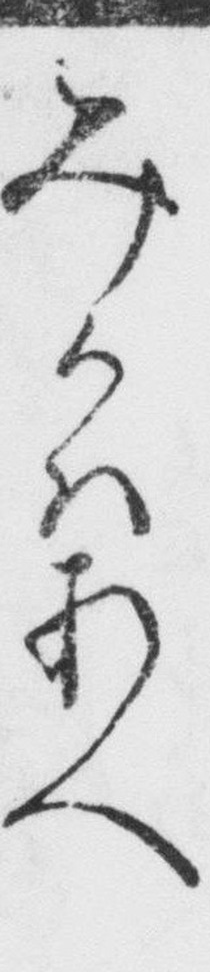みかはあへ
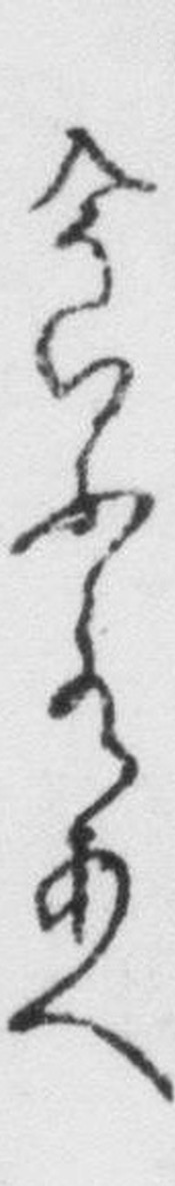今いふ水あへ

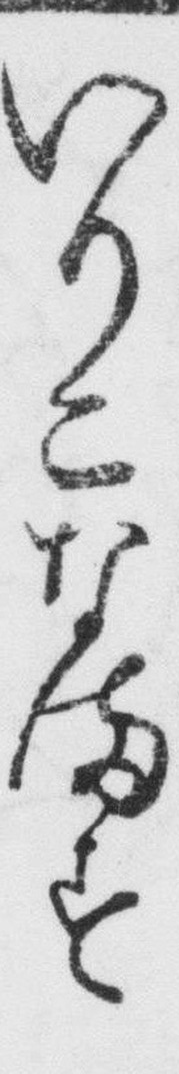いりこなます
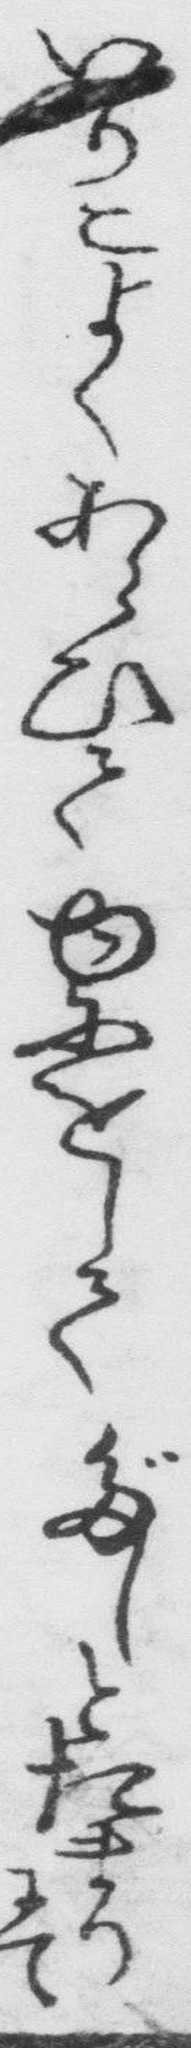いりこよくあらひてゆにをしてだしとたまりにて
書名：料理早指南
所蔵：大阪府立大学学術情報センター 国文学研究資料館
